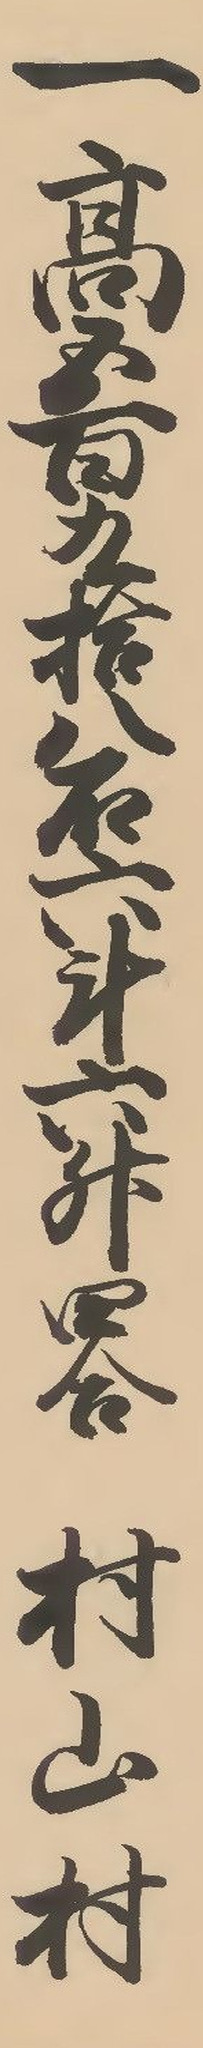一髙五百九拾八石六斗六升四合村山村
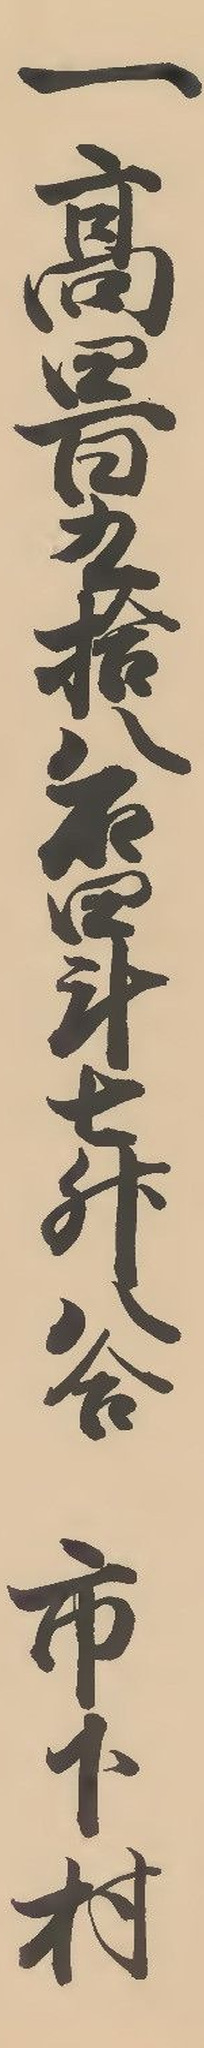一髙四百九拾八石四斗七升八合市下村
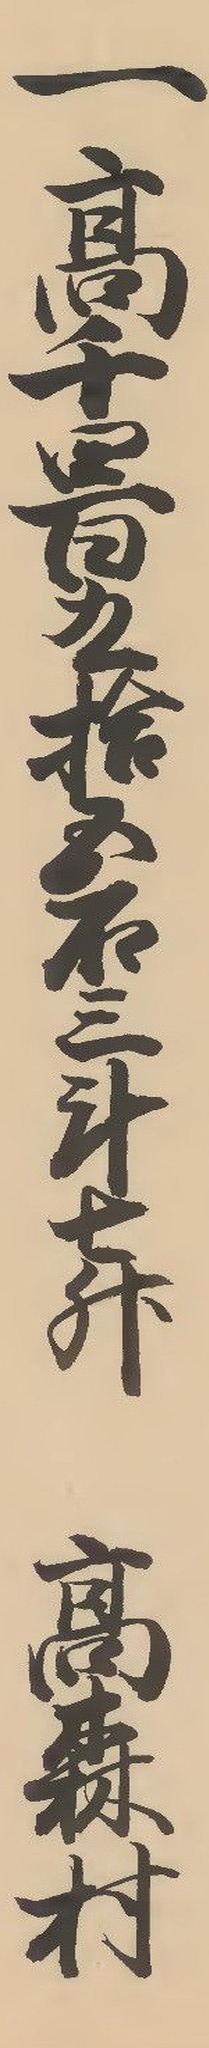一髙千四百九拾五石三斗七升髙森村
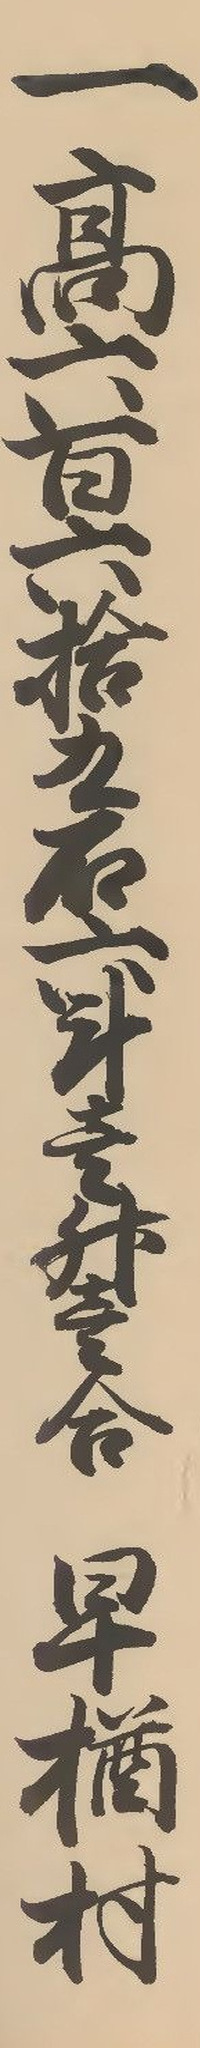一髙六百六拾九石六斗壱升壱合早楢村
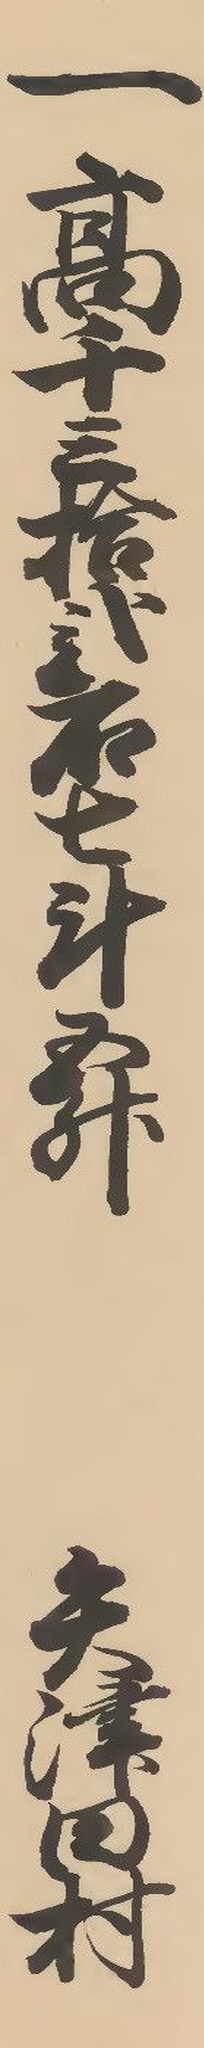一髙千三拾弐石七斗五升矢津田村
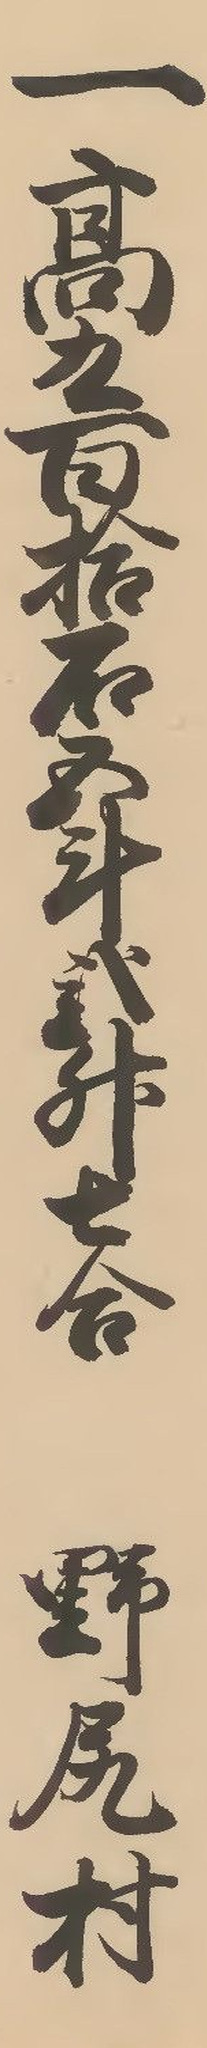一髙九百拾石五斗弐升七合野尻村
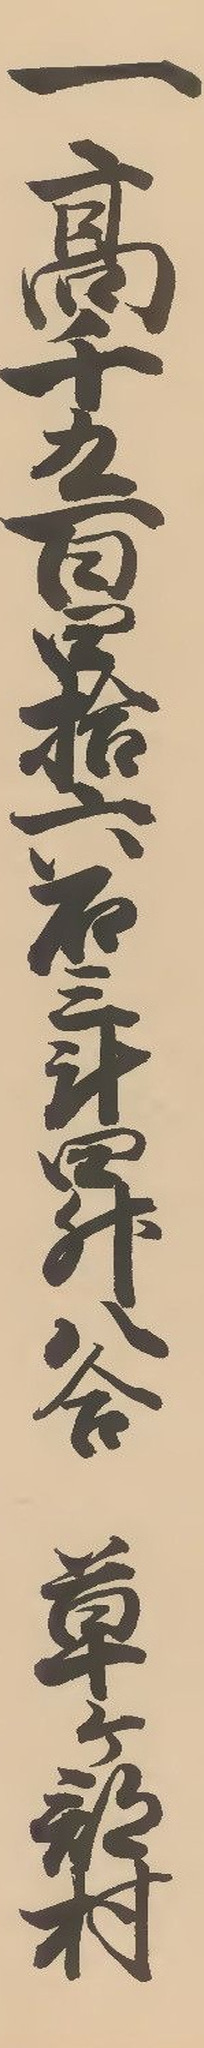一髙千九百四拾六石三斗四升八合草ケ部村
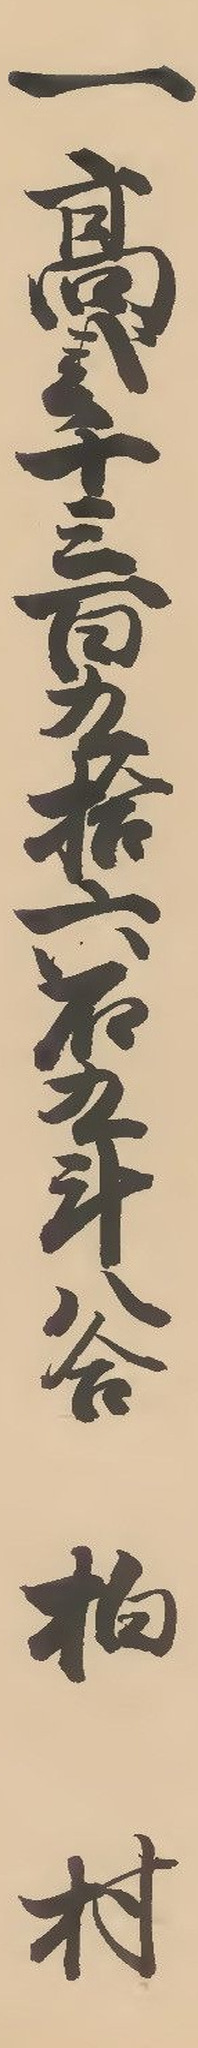一髙弐千三百九拾六石九斗八合柏村

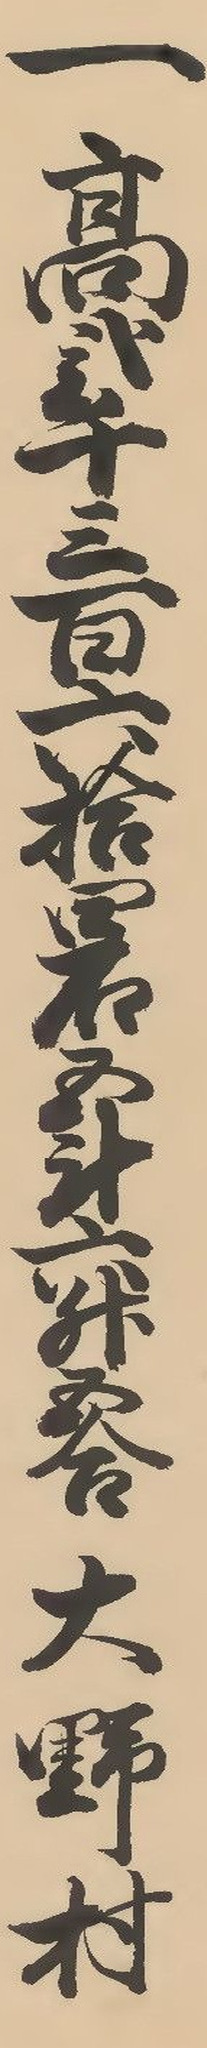一髙弐千三百六拾四石五斗六升五合大野村
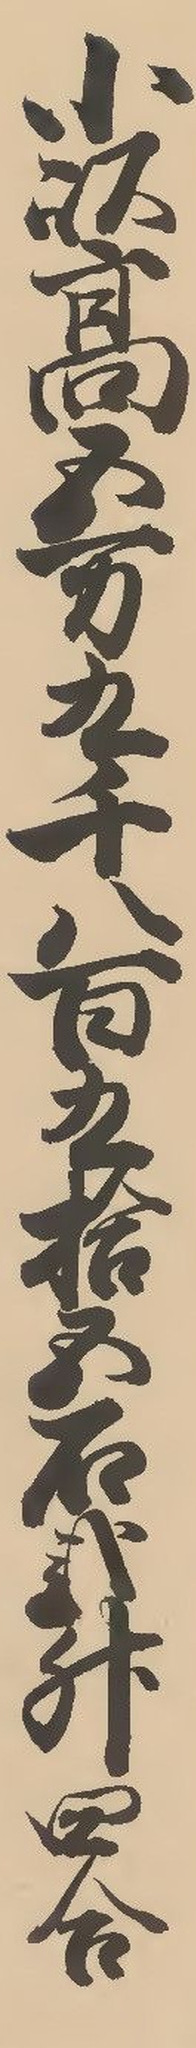小以髙五万九千八百九拾五石弐升四合
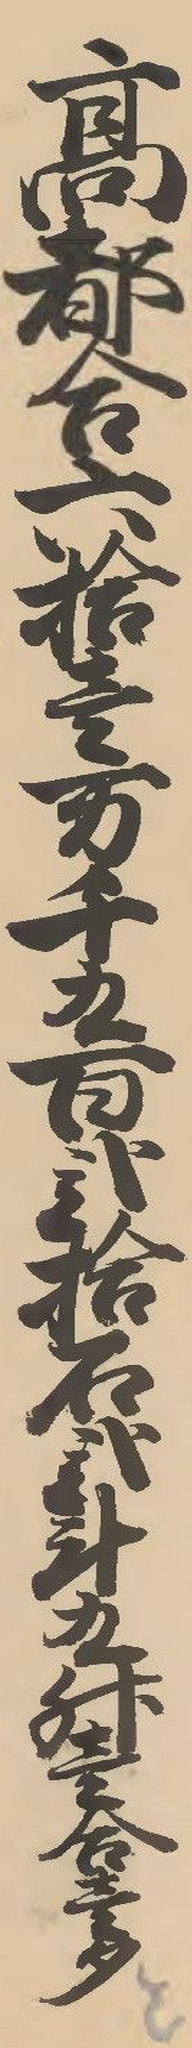髙都合六拾壱万千九百弐拾石弐斗九升壱合壱夕
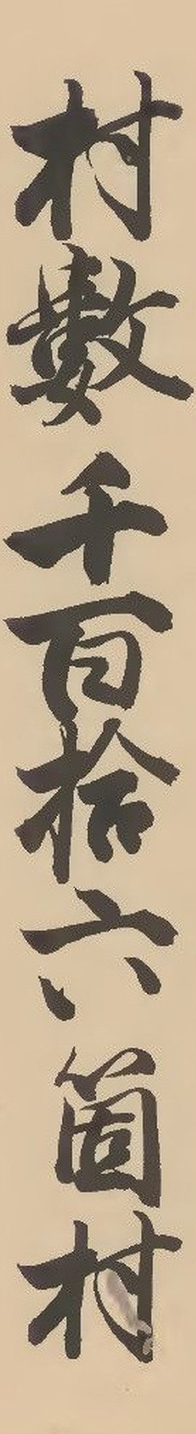村數千百拾六箇村

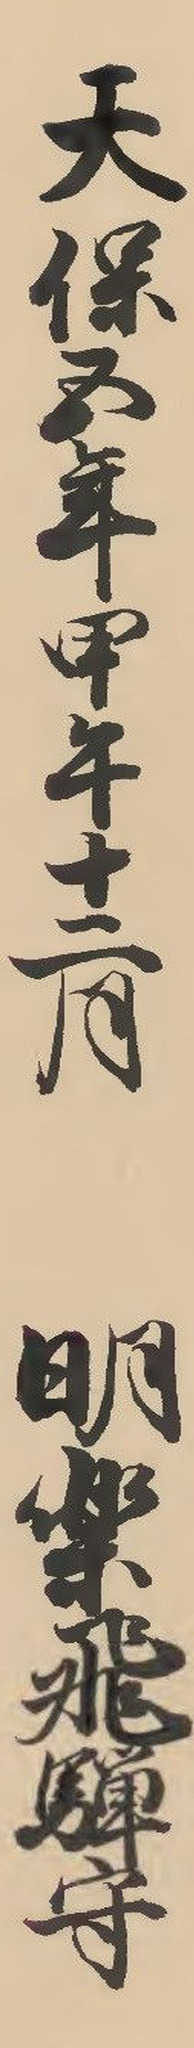天保五年甲午十二月明樂飛弾守
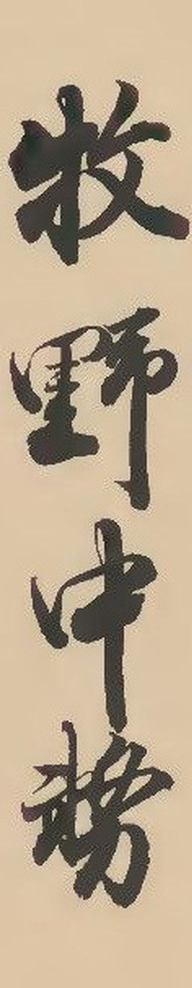牧野中務
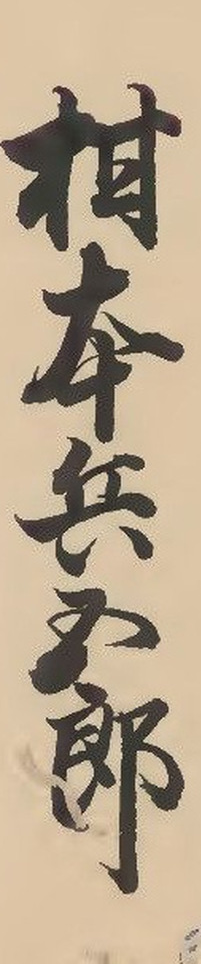柑本兵五郎
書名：肥後国郷帳
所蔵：国立公文書館 National Archives of Japan
